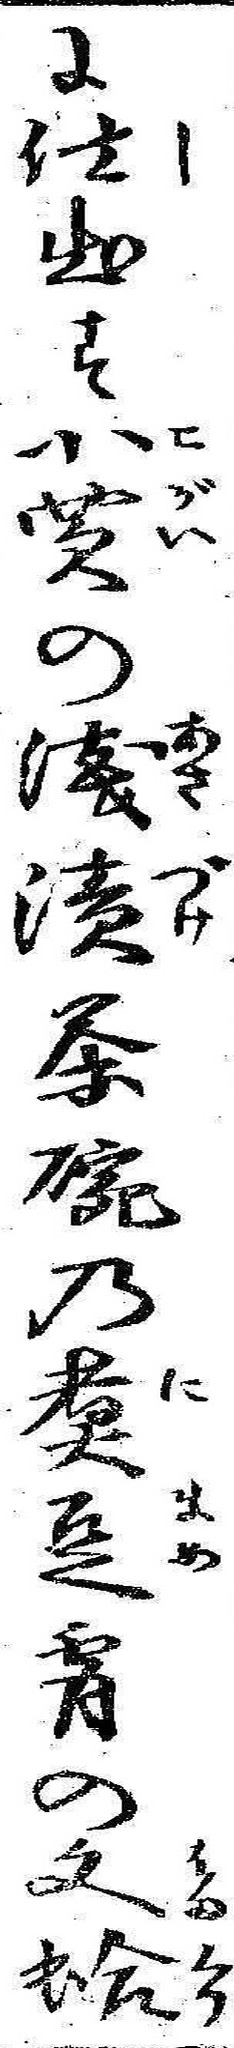に仕出す小買の浅漬茶碗の煮豆宵の文蛤
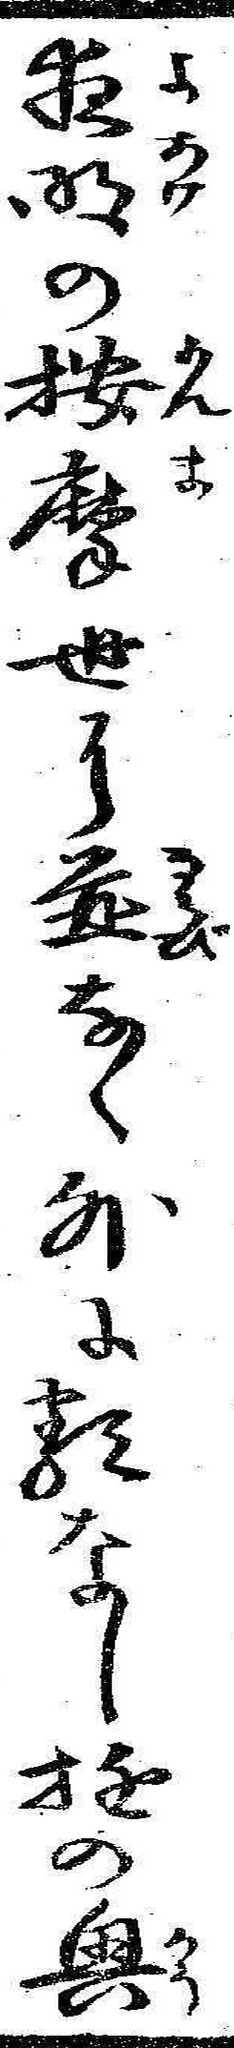夜明の按摩世に並なく外に類なし遊の興
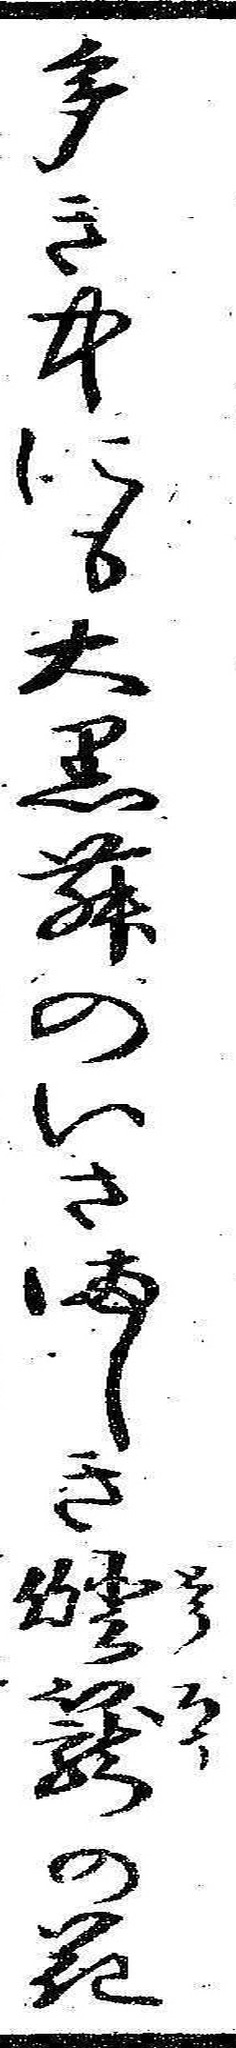多き中にも大黒舞のいさましき灯篭の花
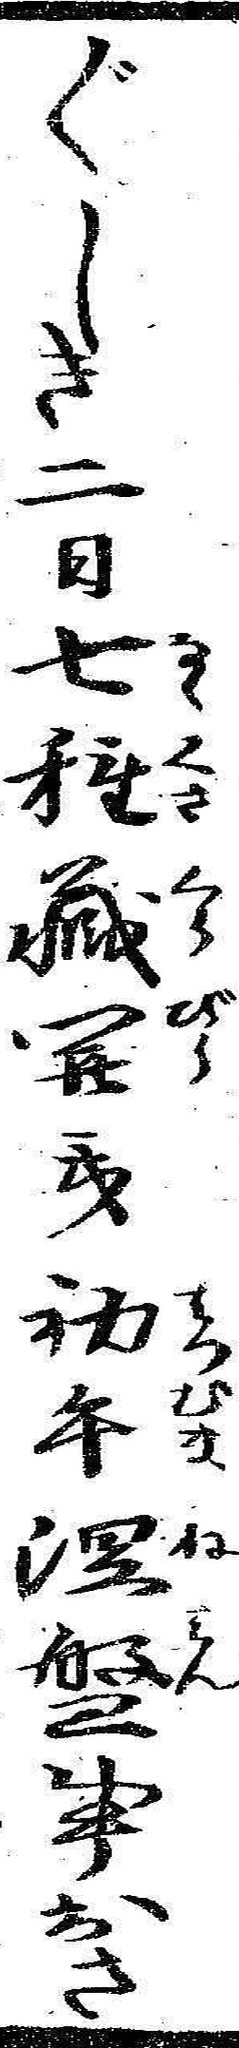〲しき二日七種蔵開き初午涅盤事おさ
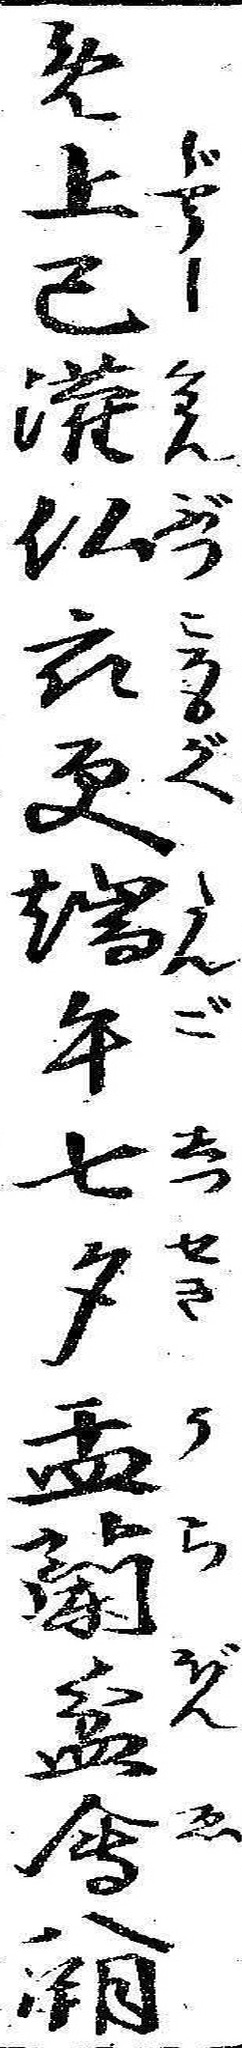め上己潅仏衣更端午七夕孟蘭盆会八朔
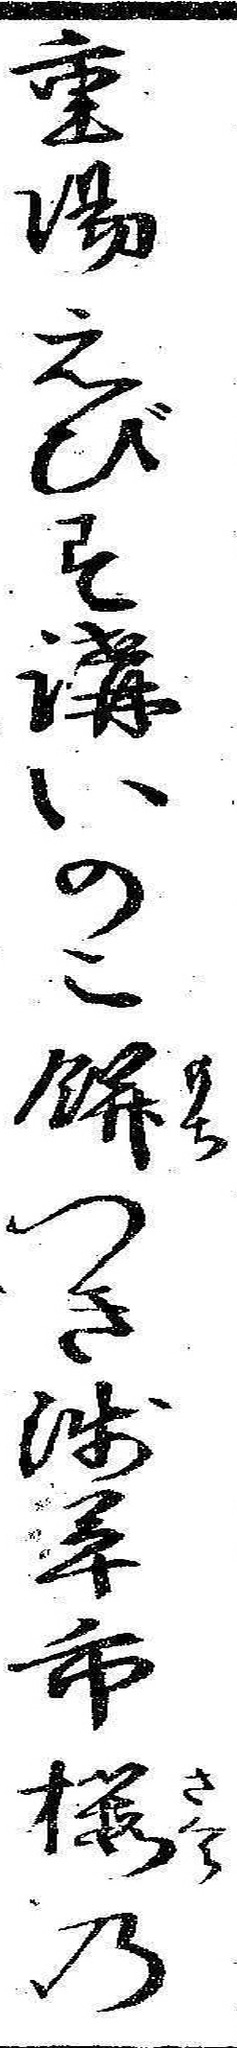重陽えびす講いのこ餅つき浅草市桜の
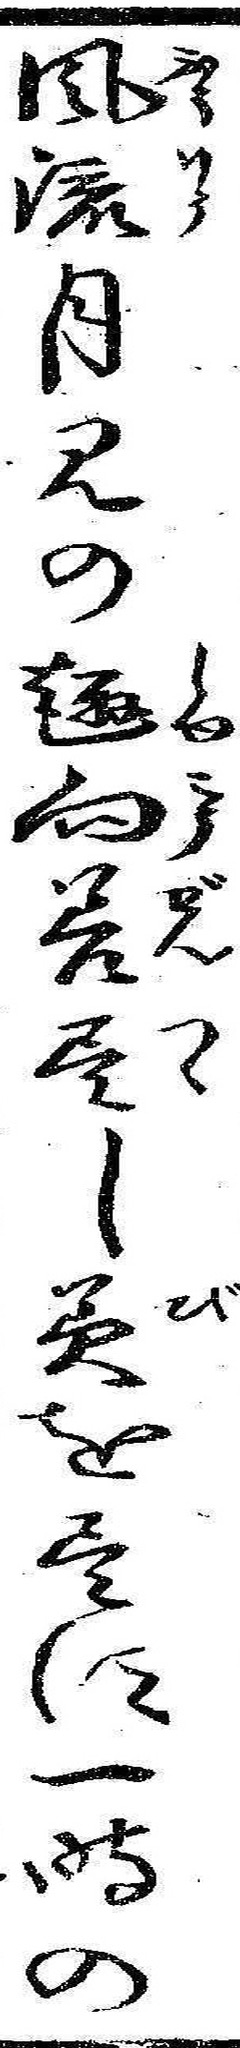風流月見の趣向善尽し美を尽す一時の
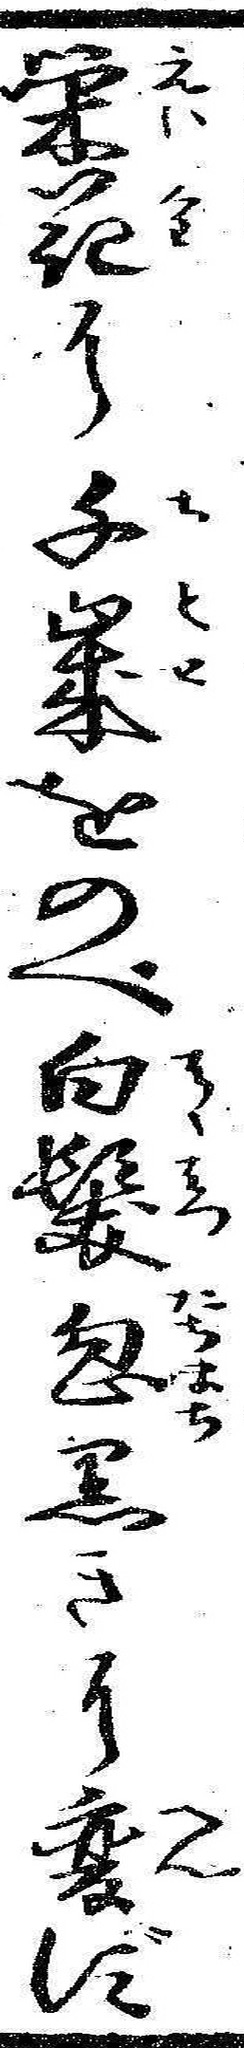栄花に千歳をのべ白髪忽黒きに変ず
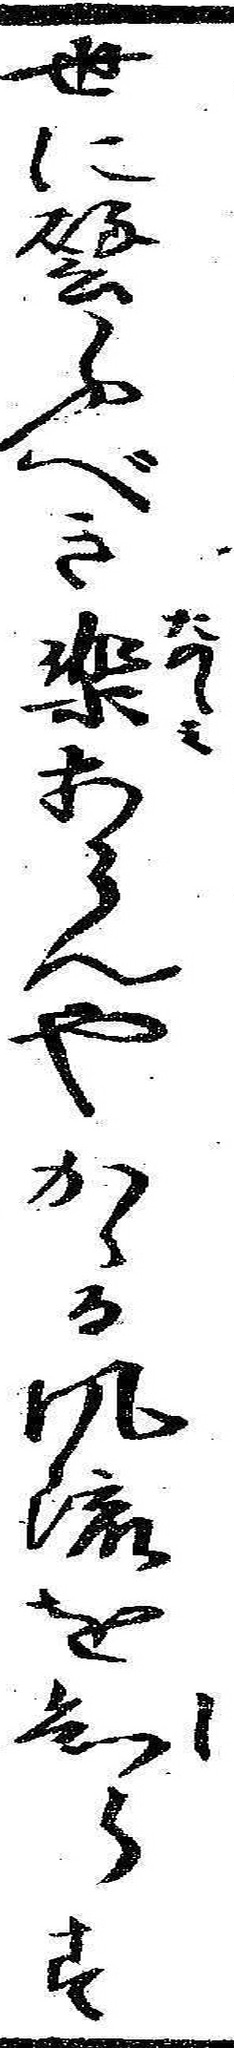世に譬ふべき楽あらんやかゝる風流を知らす
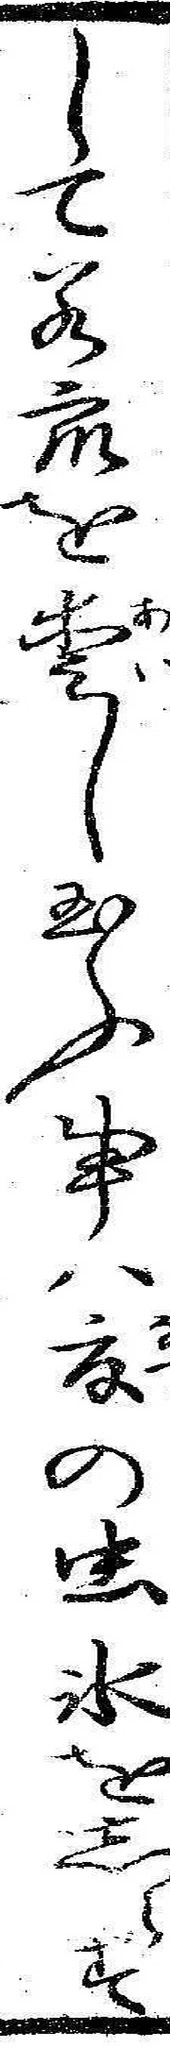して若衆を愛し玉ふ事は夏の虫氷をしらす
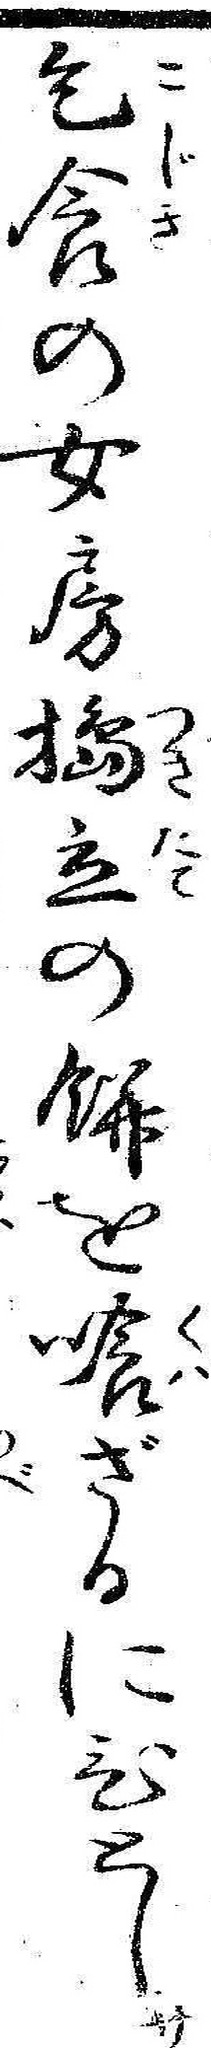乞食の女房搗立の餅を喰ざるにひとし
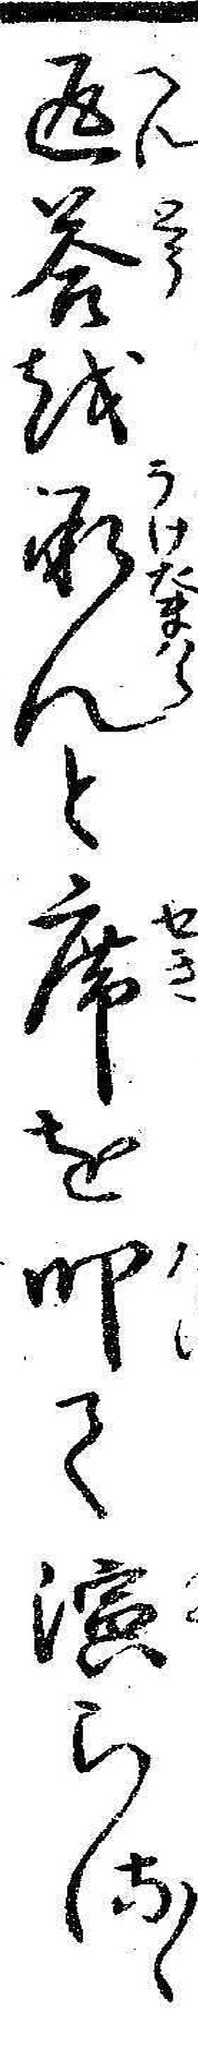返答を承んと席を叩て演らるゝ

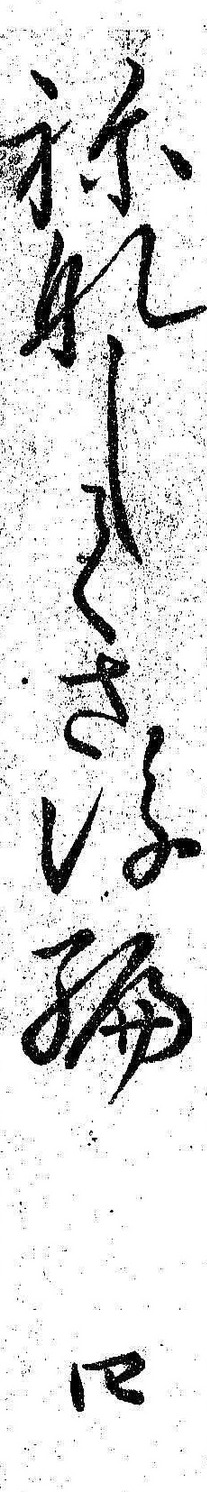ねなしくさ後編四

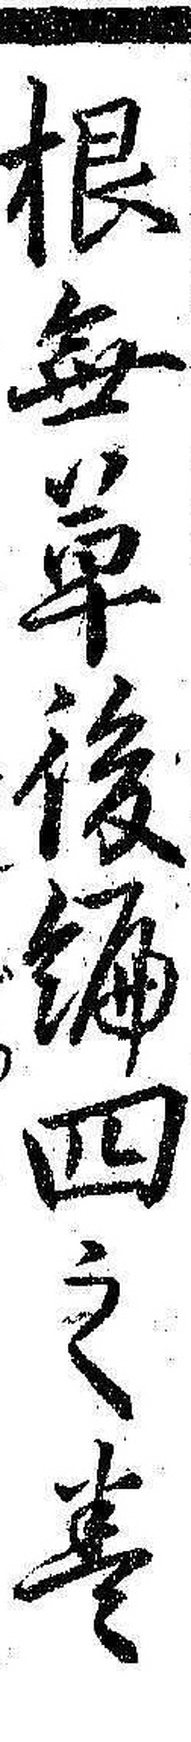根無草後編四之巻
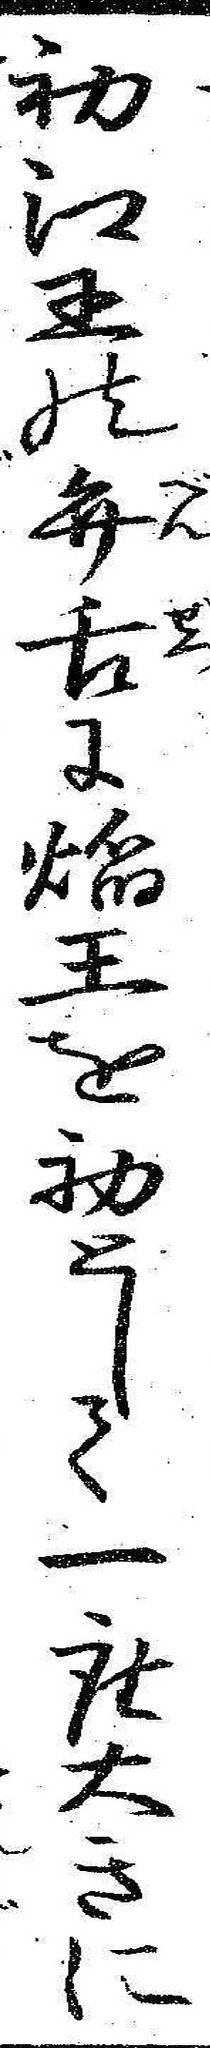初江王の弁舌に焔王を初として一座大きに
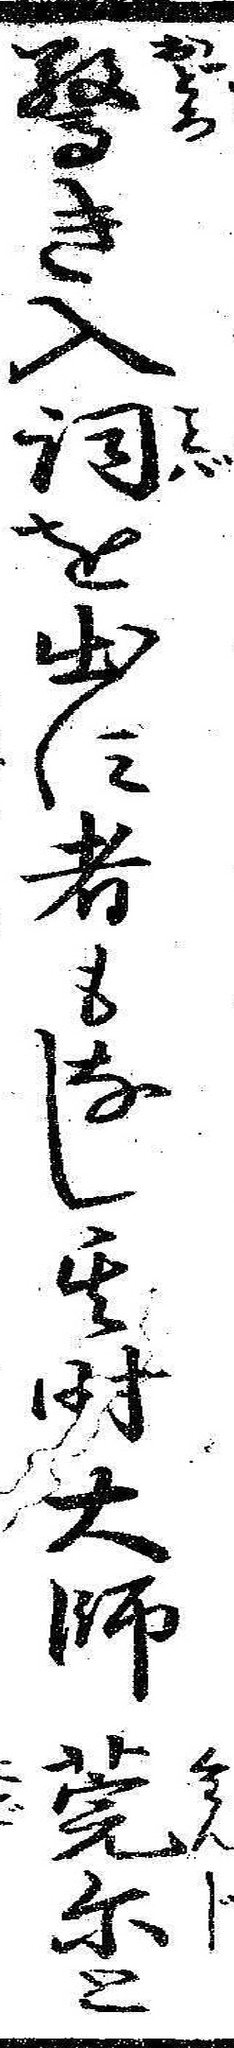驚き入詞を出す者もなし其時大師莞爾と
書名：根無草後編
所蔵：国文学研究資料館
